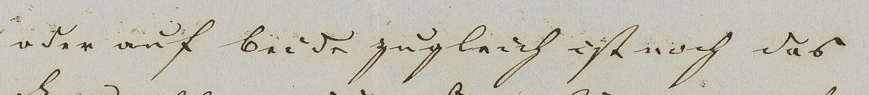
oder auf beide zugleich ist noch das
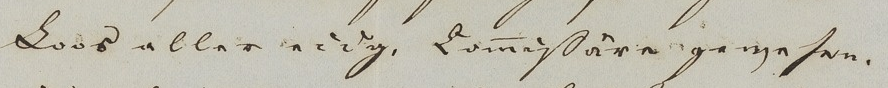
Loos aller eidg. Commissäre gewesen.
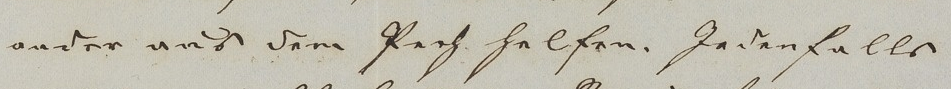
ander aus dem Pech helfen. Jedenfalls
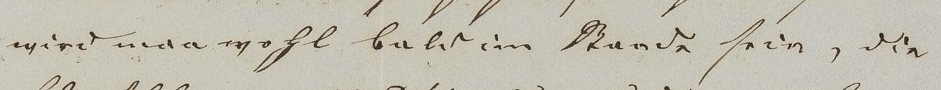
wird man wohl bald im Stande sein, die
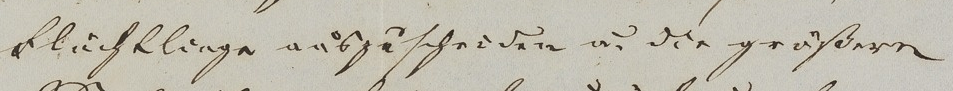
Flüchtlinge auszuscheiden u. die größere
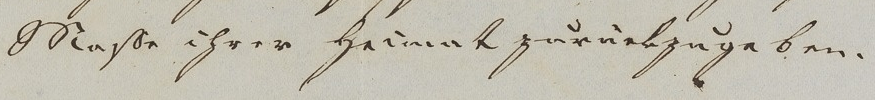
Masse ihrer Heimat zurückzugeben.
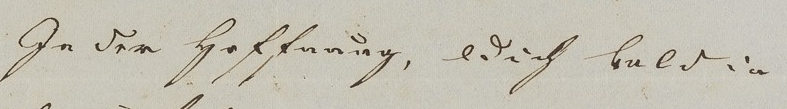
In der Hoffnung, Dich bald in
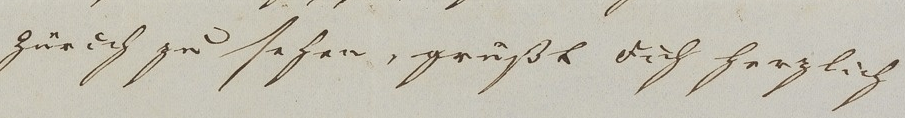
Zürich zu sehen, grüßt Dich herzlich
